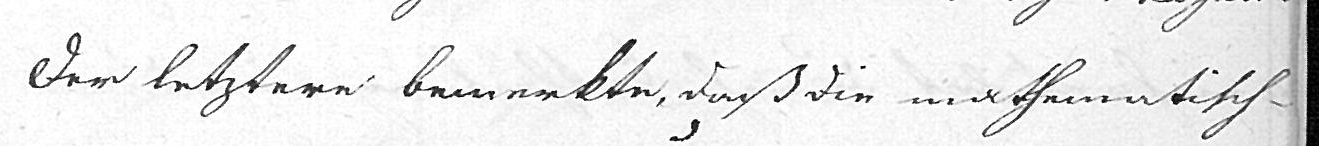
Der letztere bemerkte, daß die mathematisch-
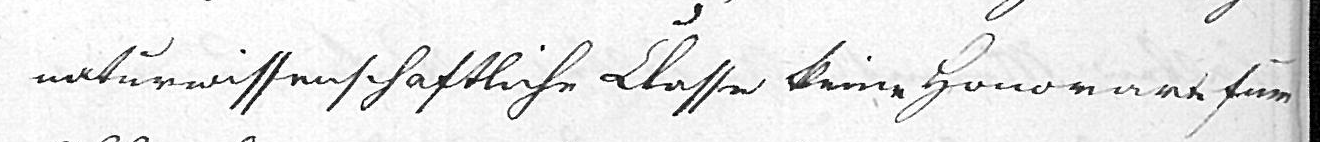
naturwissenschaftliche Classe keine Honorare für
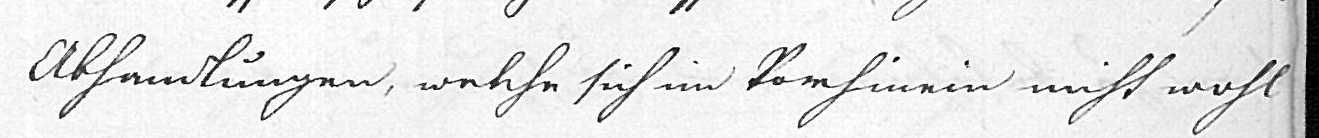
Abhandlungen, welche sich im Vorhinein nicht wohl
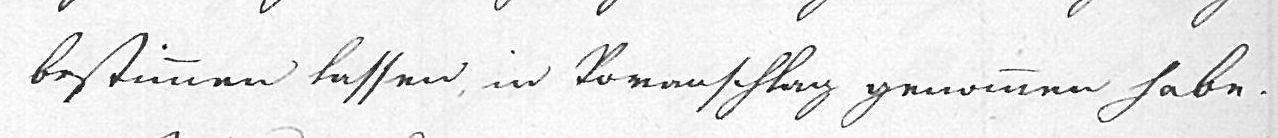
bestimmen lassne, in Voranschlag genommen habe.
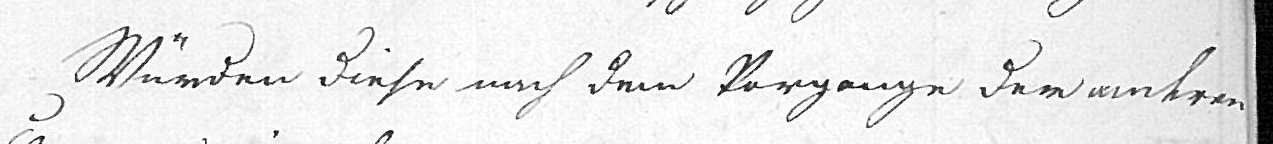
Würden diese nach dem Vorgange der anderen
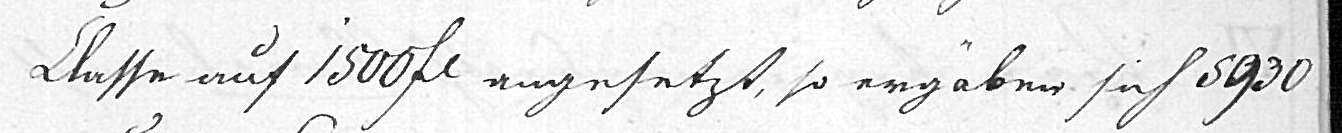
Classe auf 1500 fl angesetzt, so ergäben sich 5930
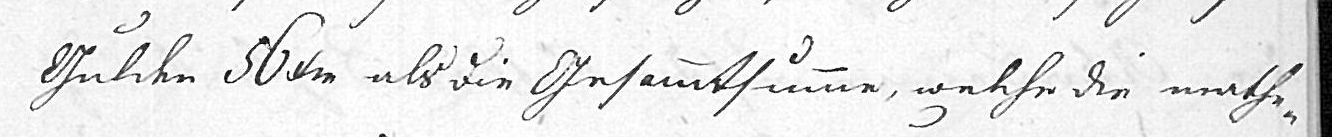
Gulden 56 Kr als die Gesammtsumme, welche die mathe-
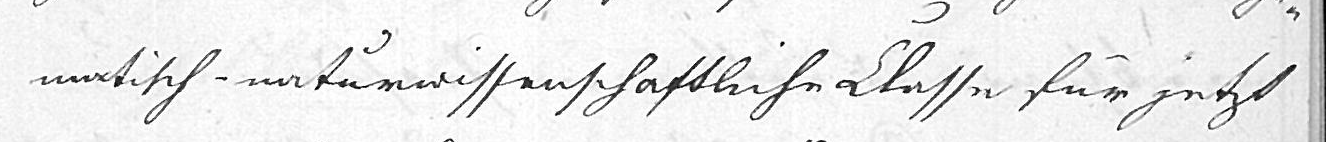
matisch-naturwissenschaftliche Classe für jetzt
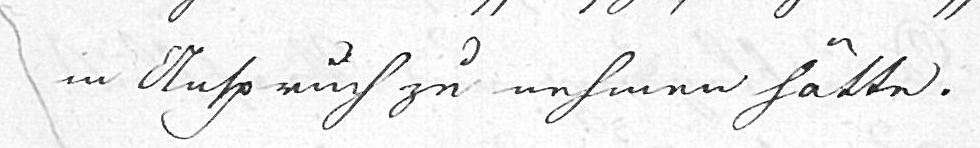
in Anspruch zu nehmen hätte.
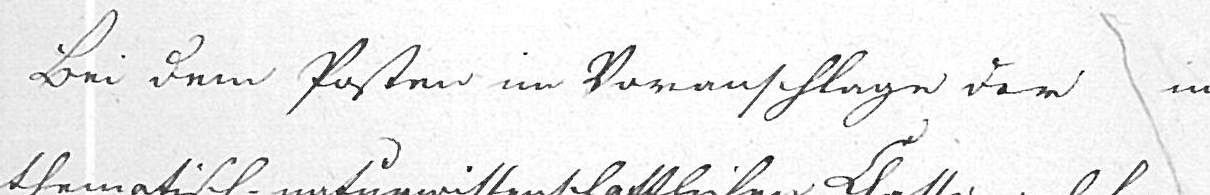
Bei dem Posten im Voranschlage der
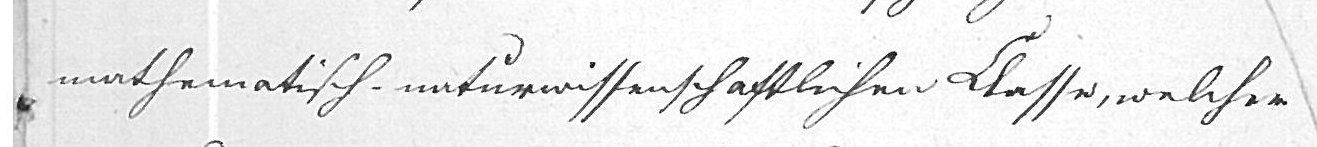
mathematisch-naturwissenschaftlichen Classe, welcher
